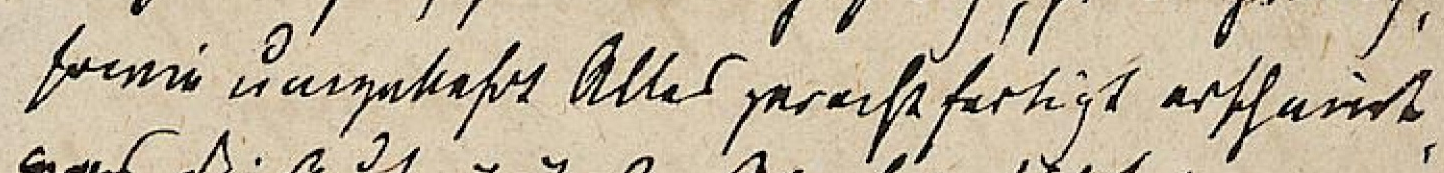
sowie unangetest Alles gerechtfertigt erscheint,
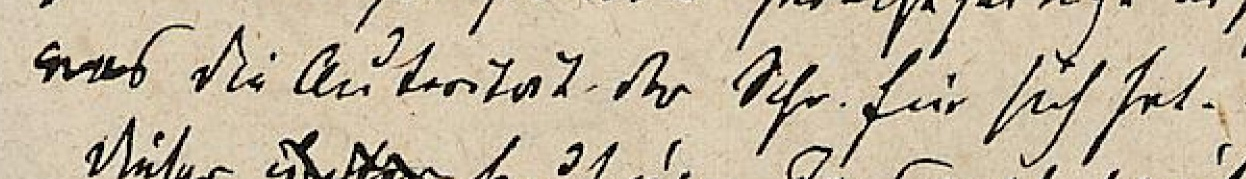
was die Autorität der Schr. für sich hat. _
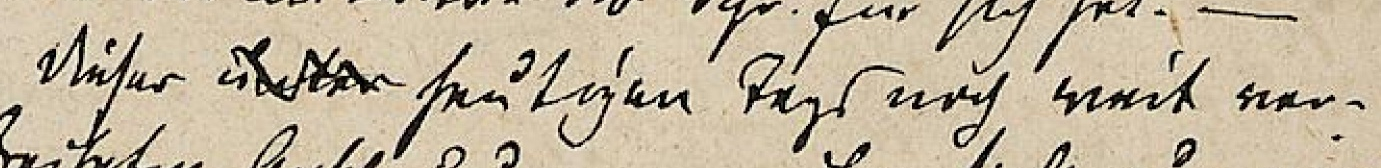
dieser unter heutigen Tags noch weit ver¬
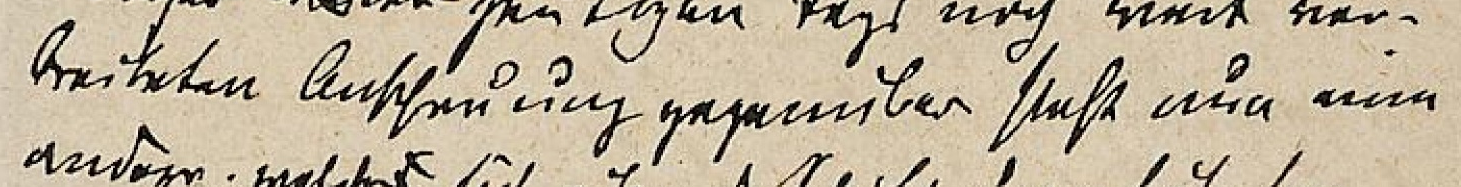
breiteten Anschauung gegenüber steht nun eine
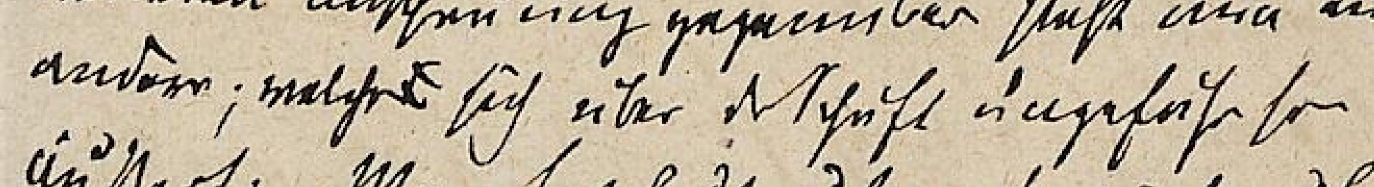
andere, welches sich über d. Schrift ungeführ so
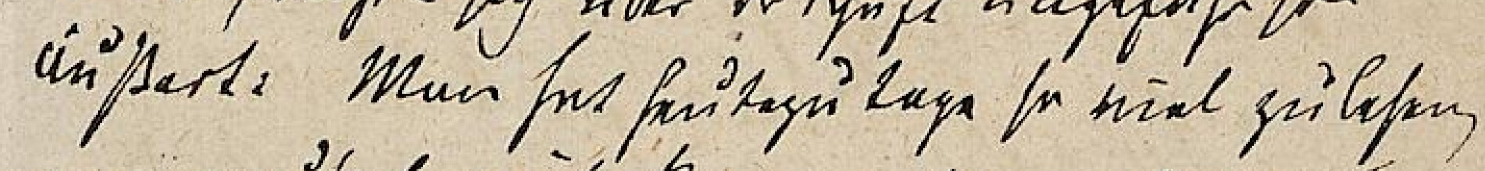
äußert: Man hat heutzutage so viel zu lesen,
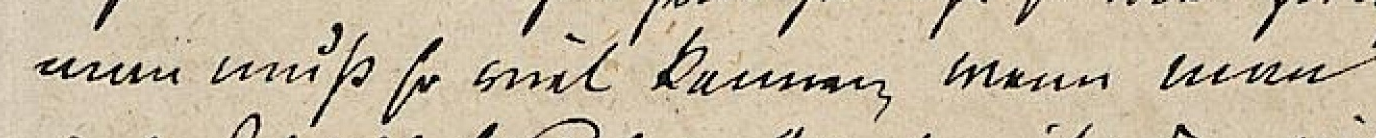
man muß so viel kennen, wenn man
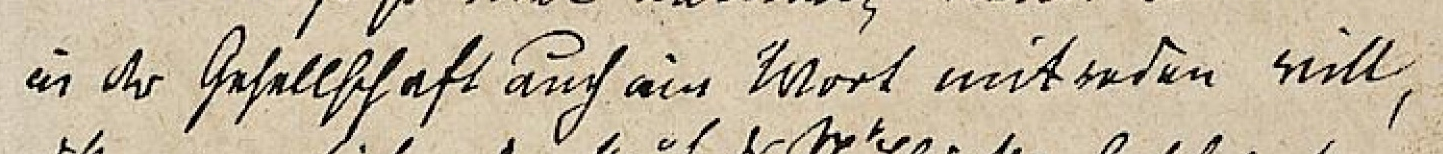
in der Geselschaft auch ein Wort mittreden will
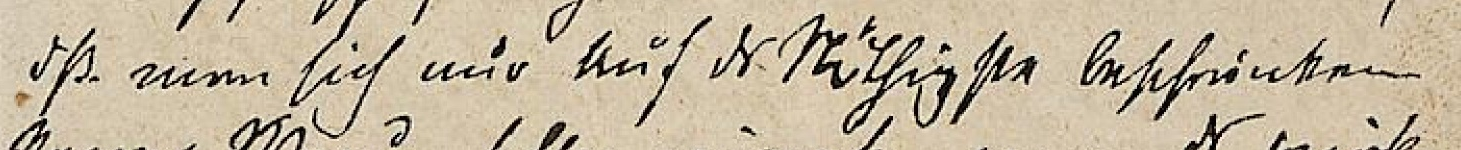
dß man sich nur Auf ds Nöthigste beschränken
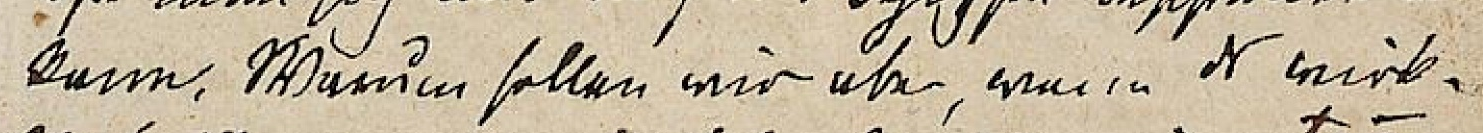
kann. Warum sollen wir aber, wenn ds wirk¬
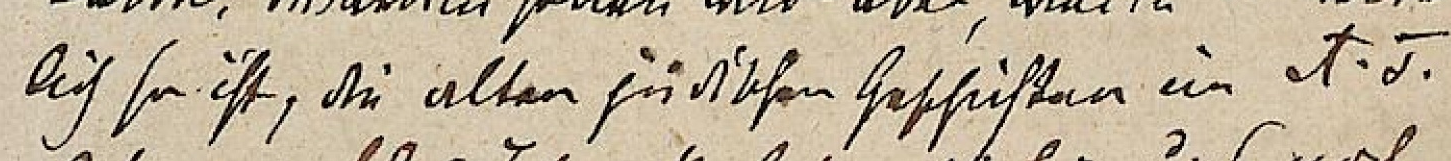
lich so ist, die alten jüdishen Geschichten im A. T.
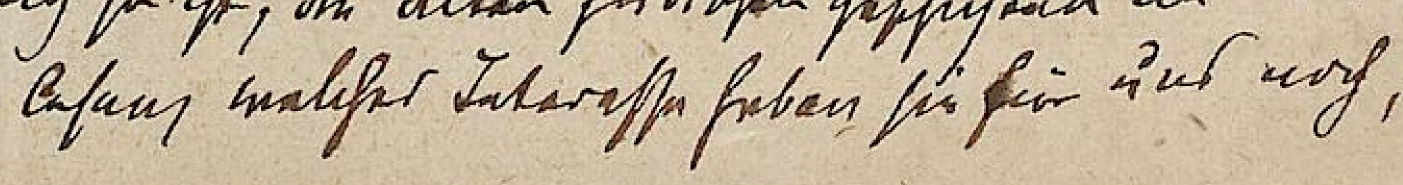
lesen, welches Interesse haben sie fein uns noch,
